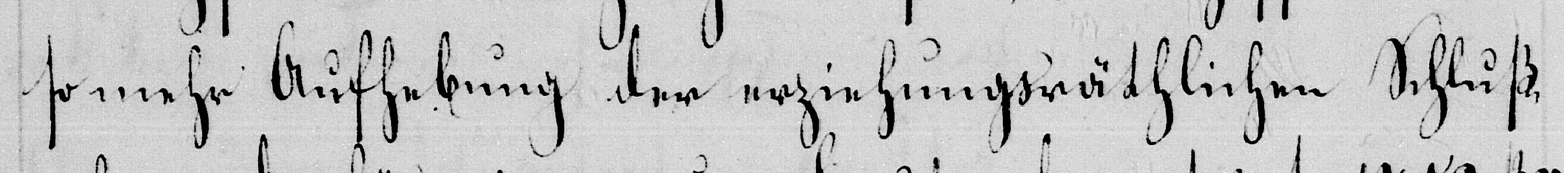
so mehr Aufhebung der erziehungsräthlichen Schluß¬
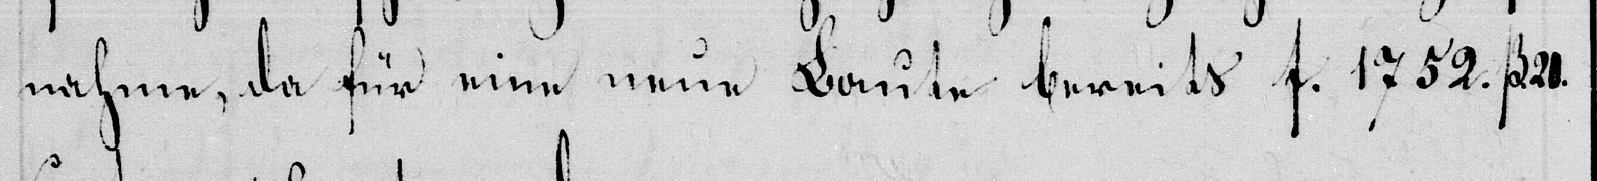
nahme, da für eine neue Baute bereits f. 1752. ß. 20.
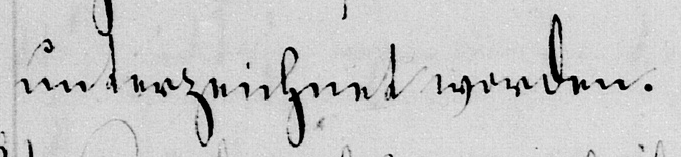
unterzeichnet worden.
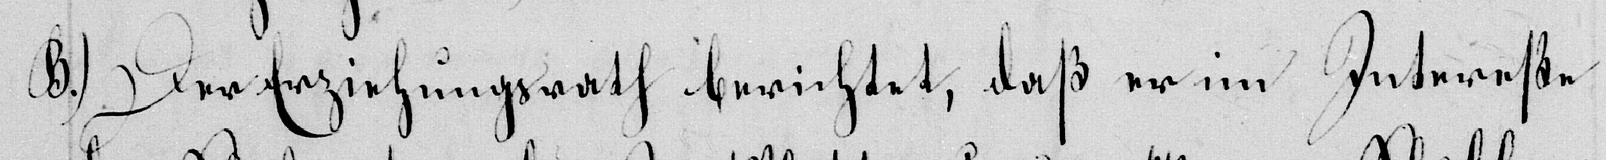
B.) Der Erziehungsrath berichtet, daß er im Intereße
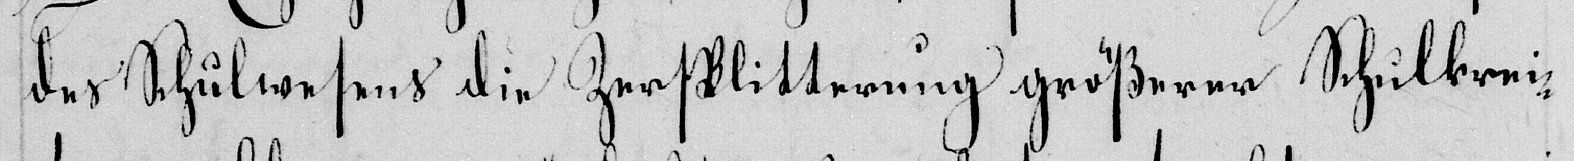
des Schulwesens die Zersplitterung größerer Schulkrei¬
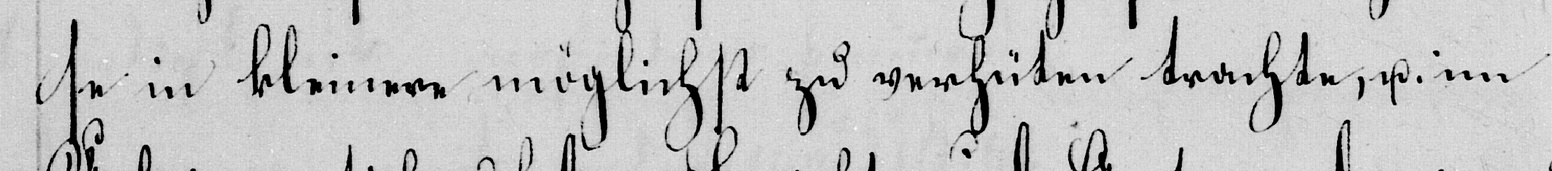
se in kleinere möglichst zu verhüten trachte, u. im
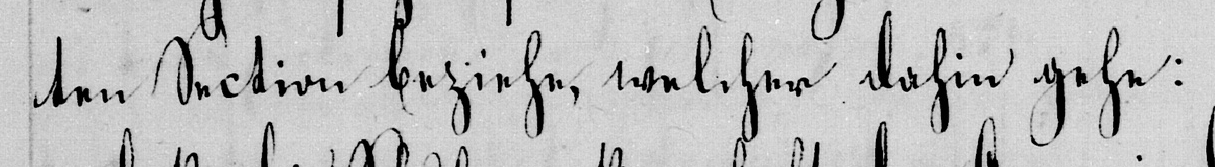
ten Section beziehe, welcher dahin gehe:
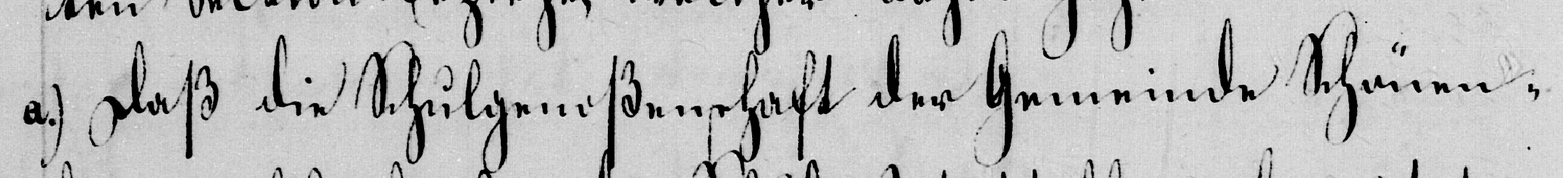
a.) Daß die Schulgenoßenschaft der Gemeinde Schönen¬
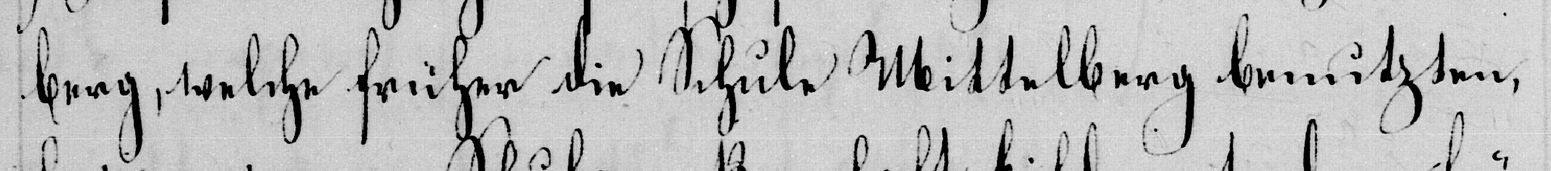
berg, welche früher die Schule Mittelberg benutzten,
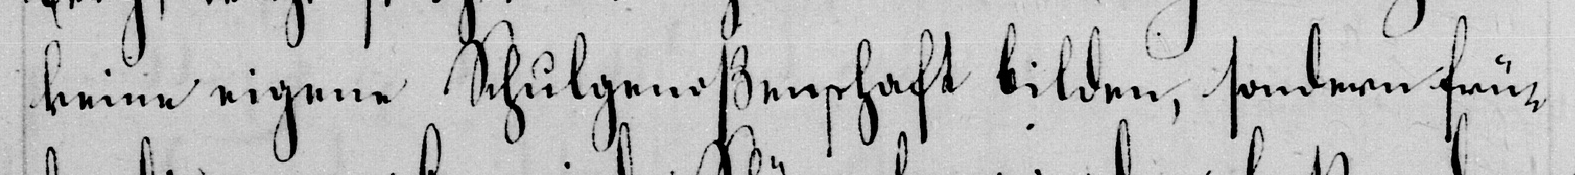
keine eigene Schulgenoßenschaft bilden, sondern frü¬
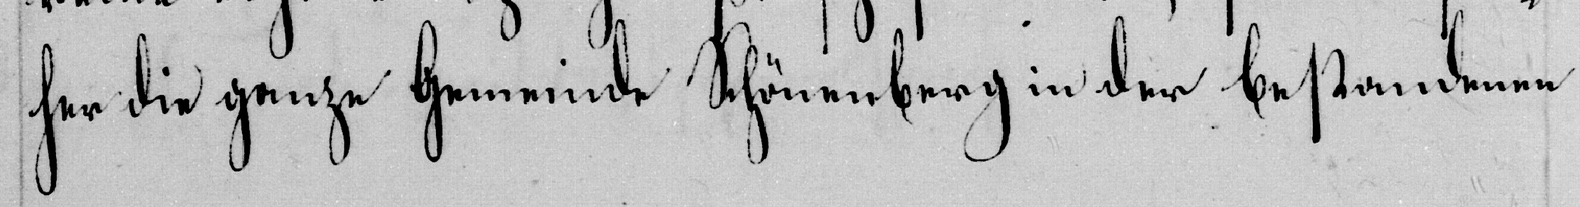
her die ganze Gemeinde Schönenberg in der bestandenen
